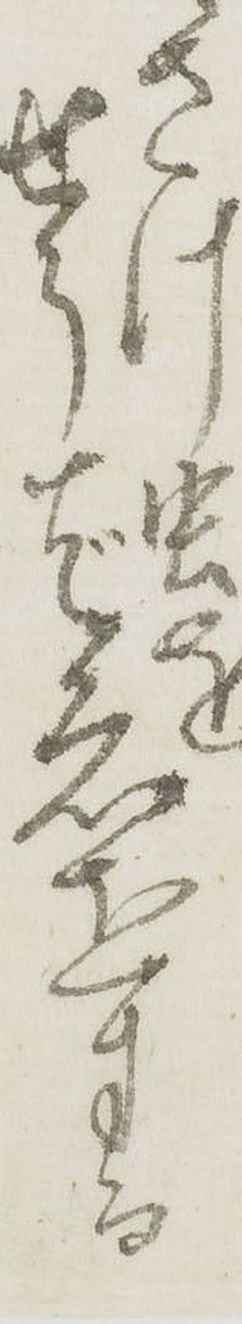せうばいをする

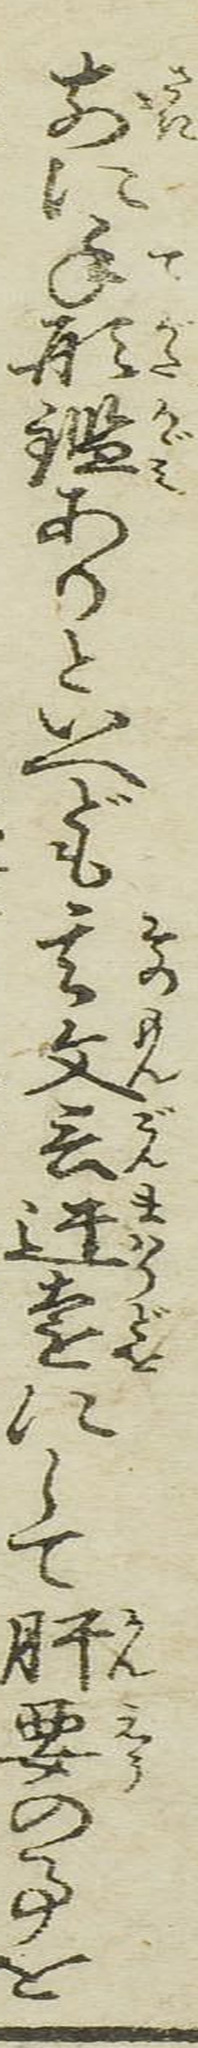前に手形鑑ありといへども其文言迂遠にして肝要の事を
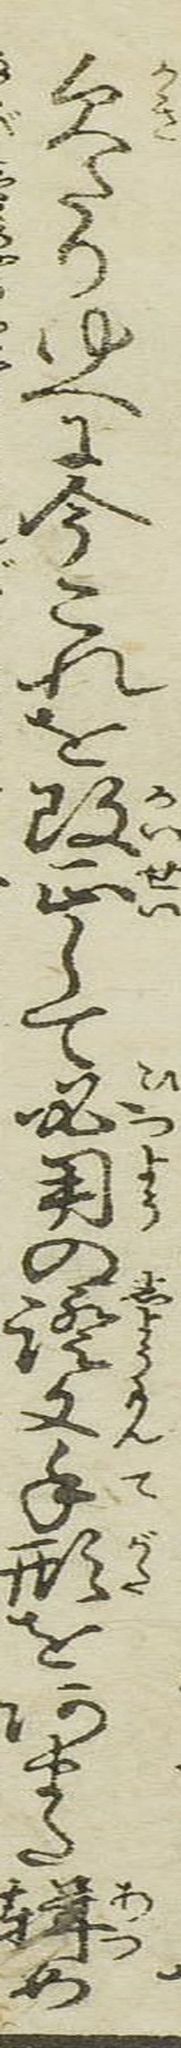欠たりゆへに今これを改正して必用の証文手形をあまた輯め
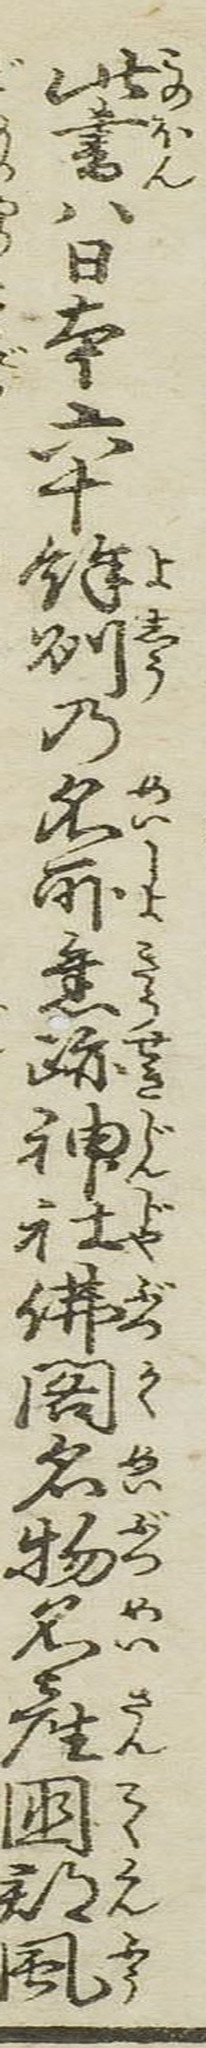此書は日本六十余州の名所旧跡神社仏閣名物名産国郡風
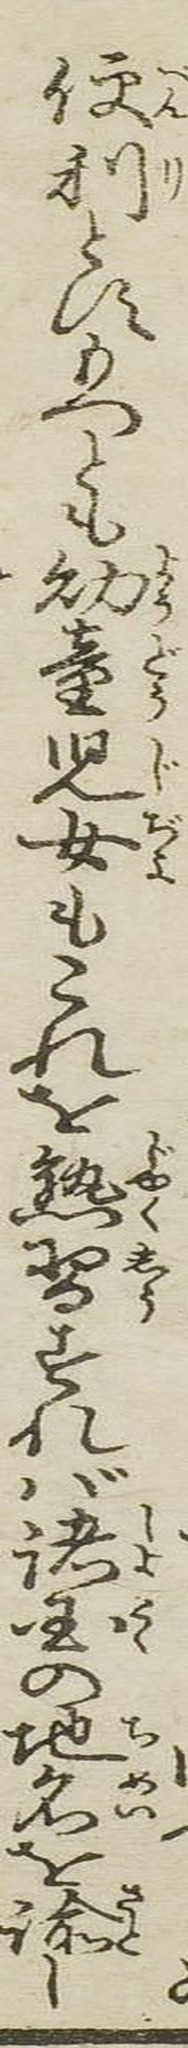土物成石高等を幼童児女もこれを熟習すれば諸国の地名を諭し
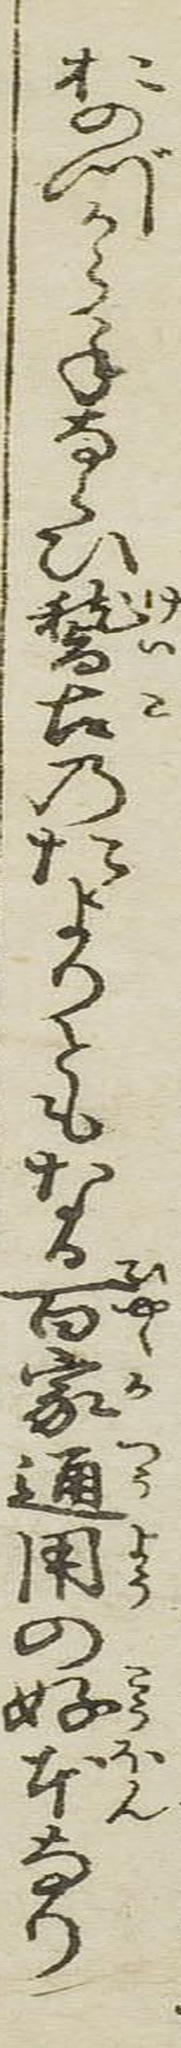おのづから手ならひ稽古のたよりともなる百家通用の好本なり
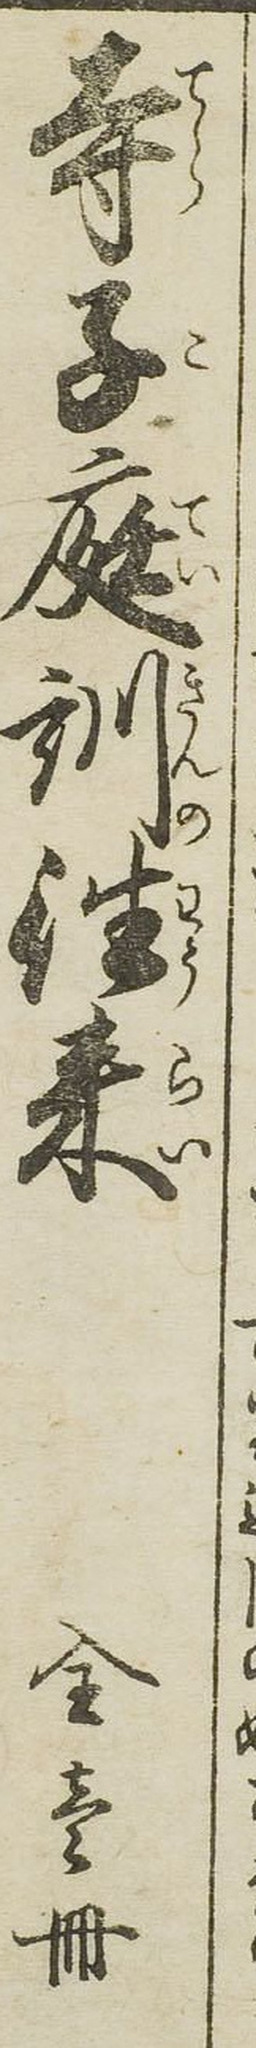寺子庭訓往来全壱冊
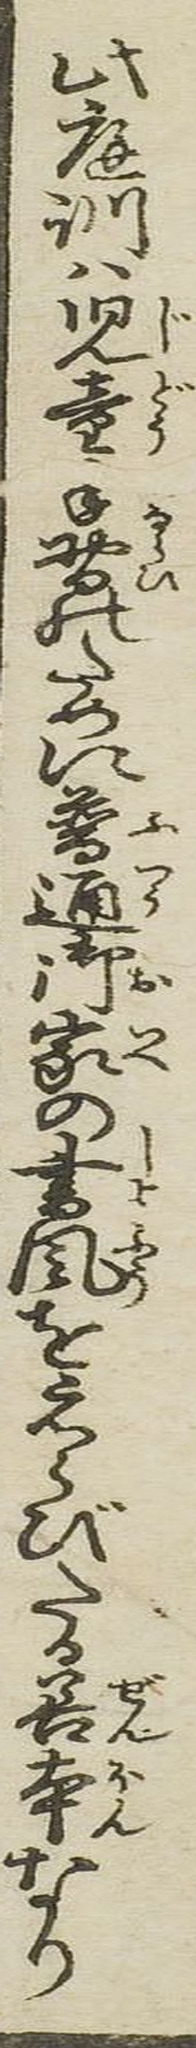此庭訓は児童手習のために普通御家の書風をえらびたる善本なり
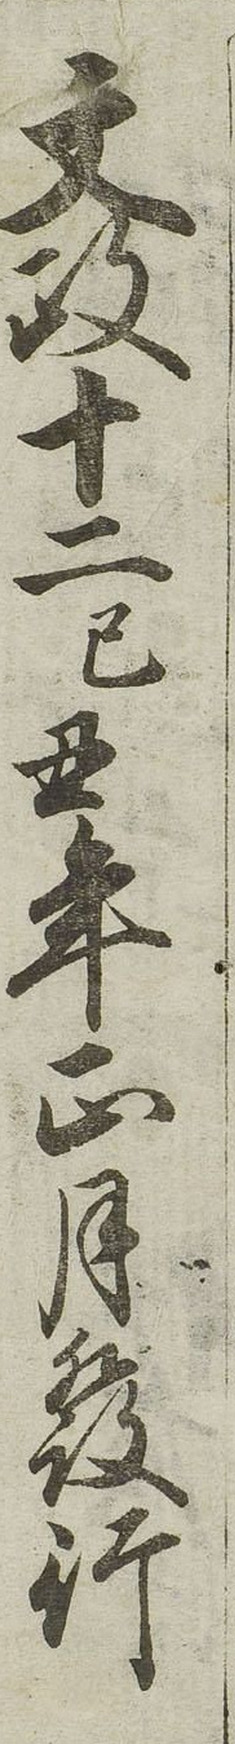文政十二己丑年正月発行
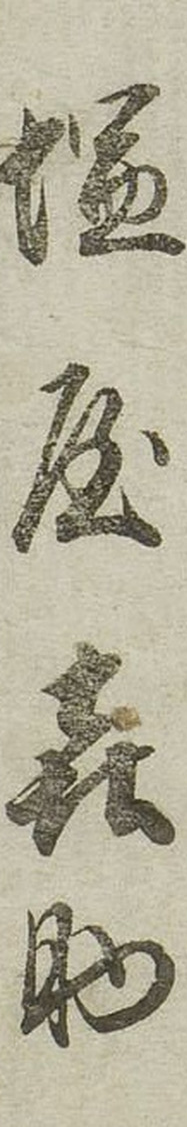塩屋喜助
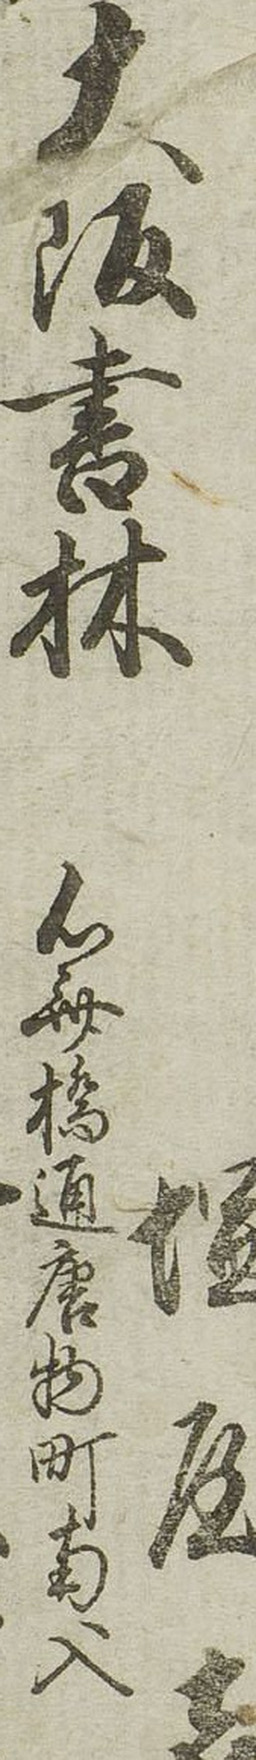大阪書林心斎橋通唐物町南へ入
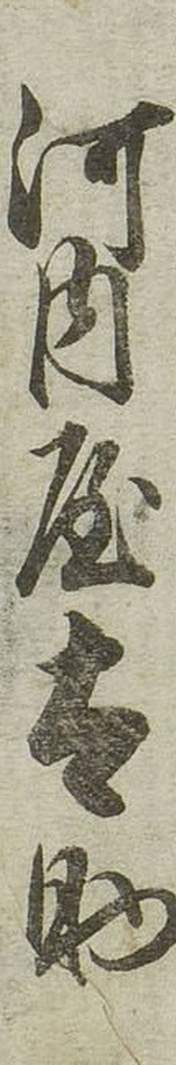河内屋太助
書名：商人書翰便覧
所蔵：東京学芸大学教育コンテンツアーカイブ
